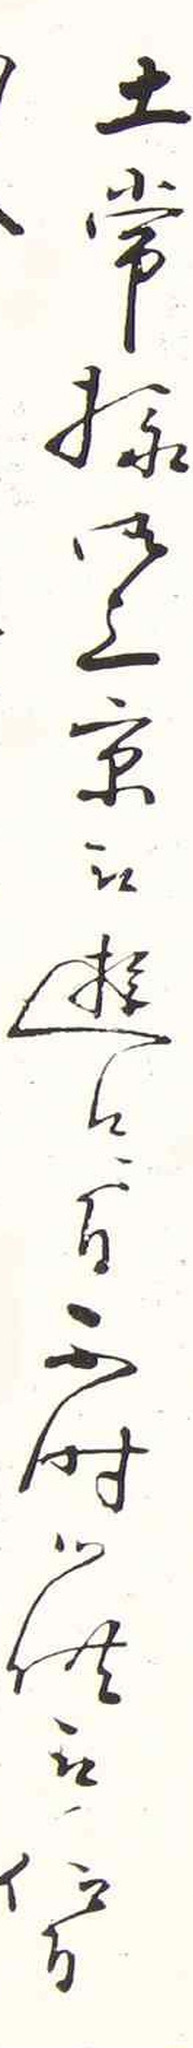土常様御上京被遊候ニ付不時御供被仰付
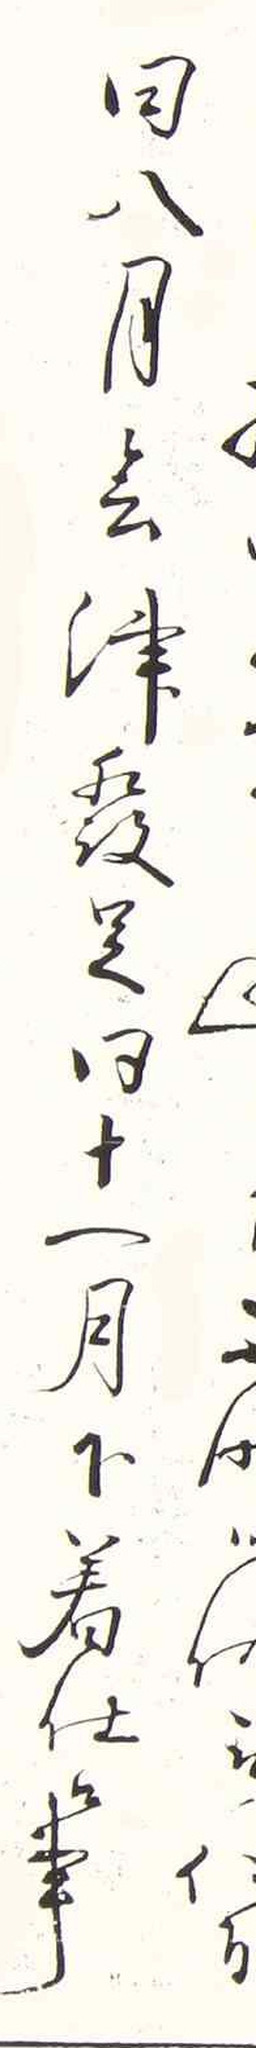同八月会津発足同十一月下着仕候事

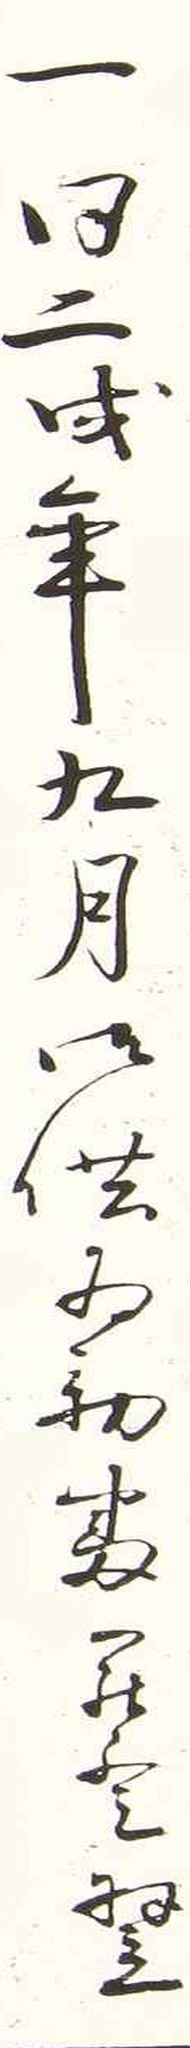一同二戌年九月御供為勤番罷登翌
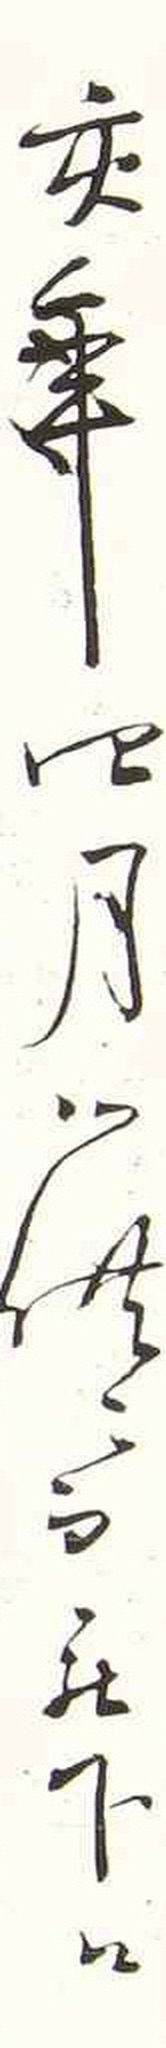亥年四月御供ニ而罷下候
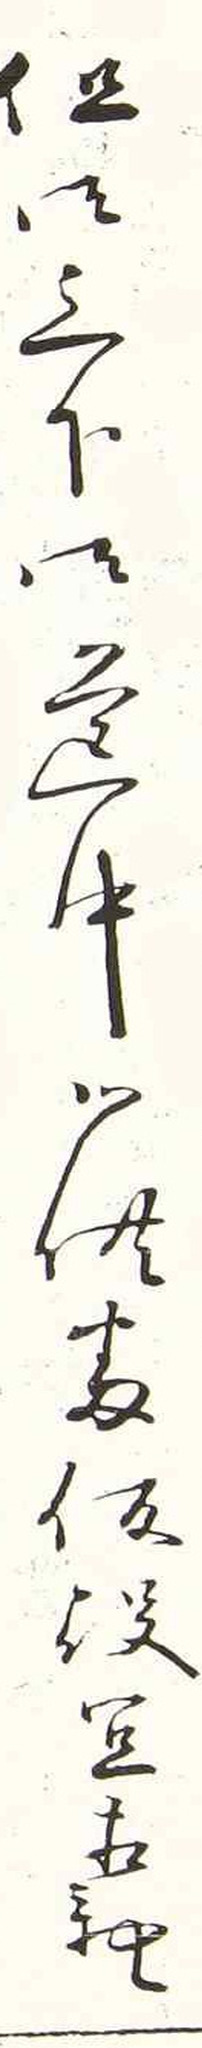但御上下御道中御供番仮役宜相勤候
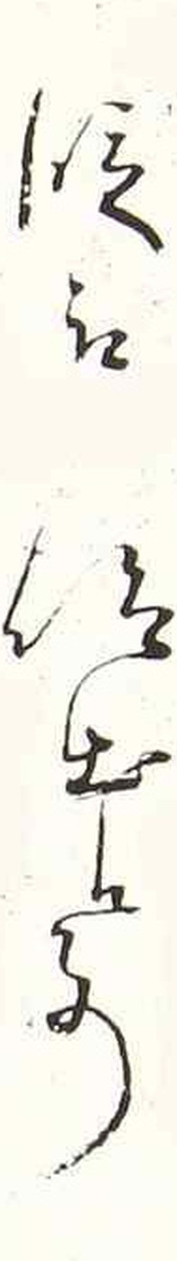段被仰出候事
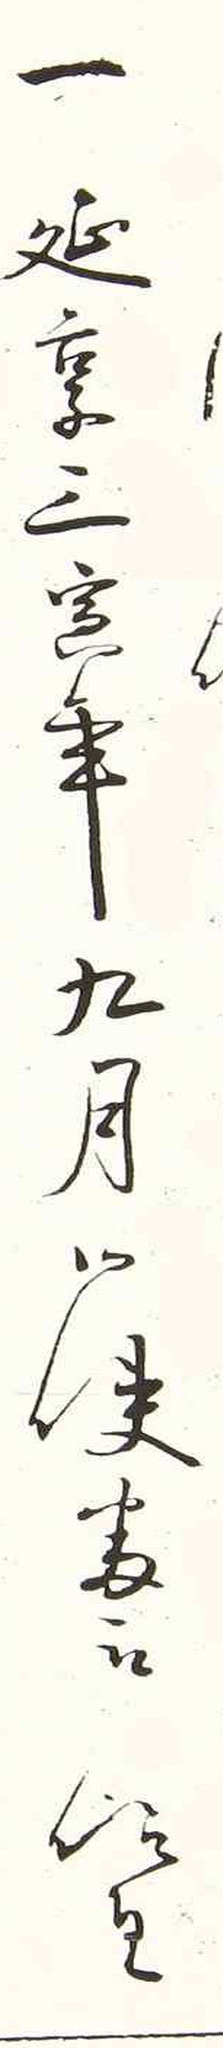一延享三寅年九月御使番被仰付候
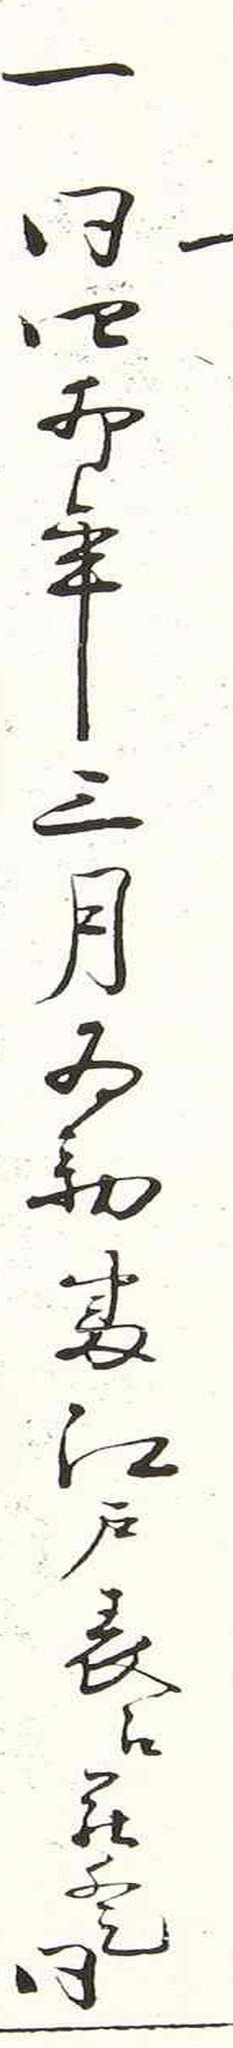一同四卯年三月為勤番江戸表江罷登同
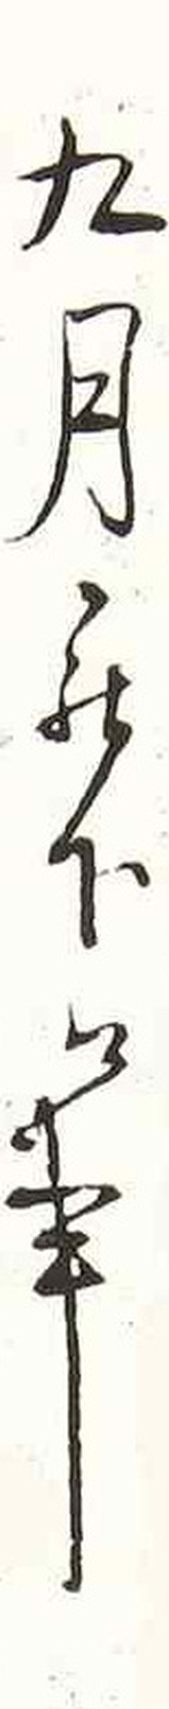九月罷下候事
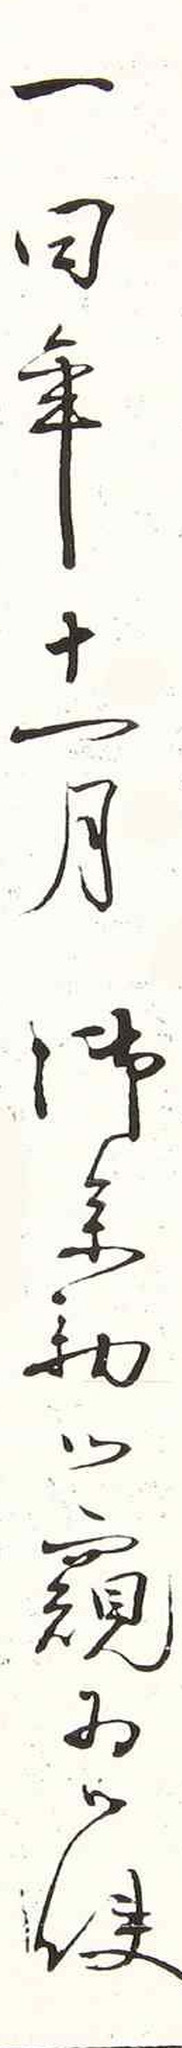一同年十一月御参勤御窺為御使
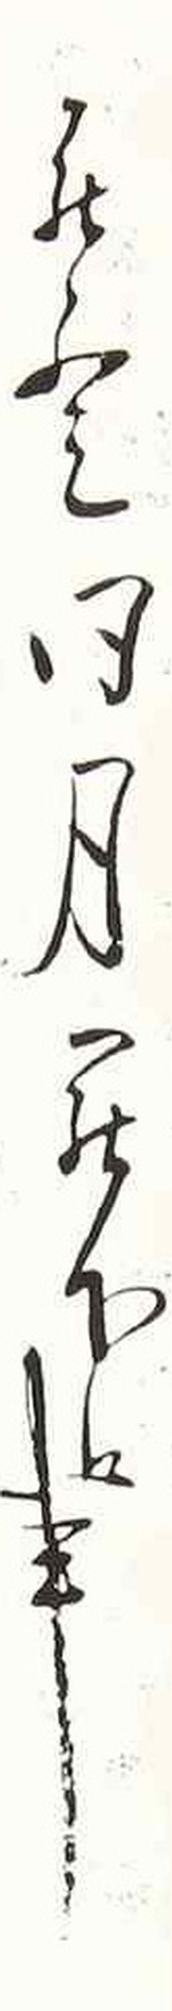罷登同月罷下候事
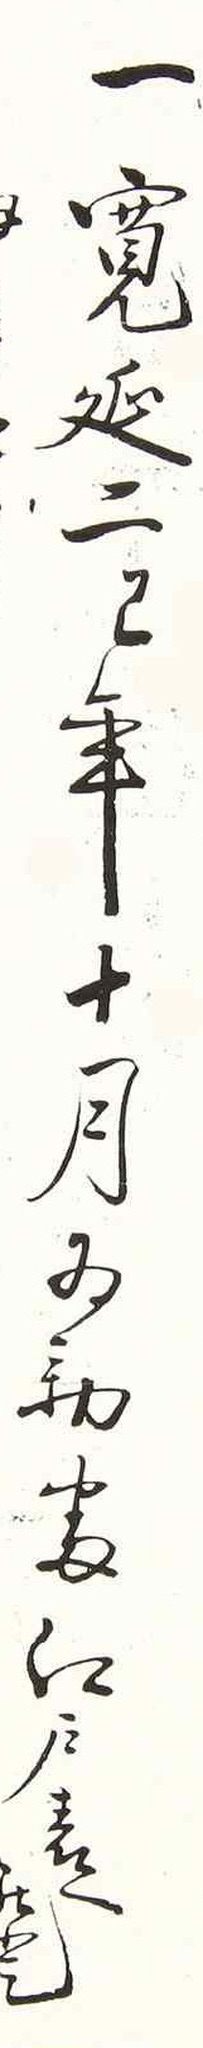一寛延二巳年十月為勤番江戸表へ罷登
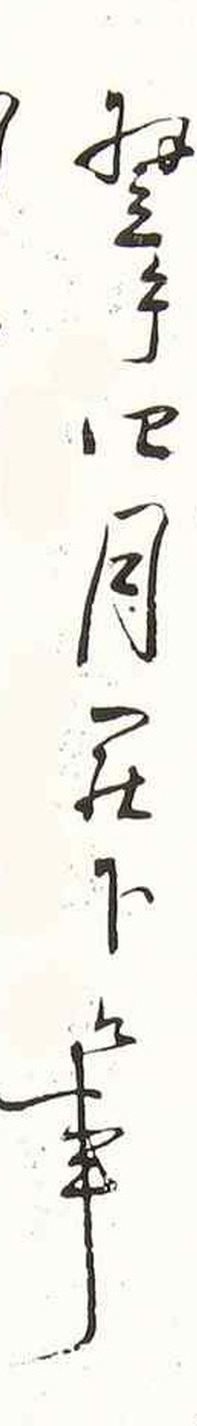翌午四月罷下候事
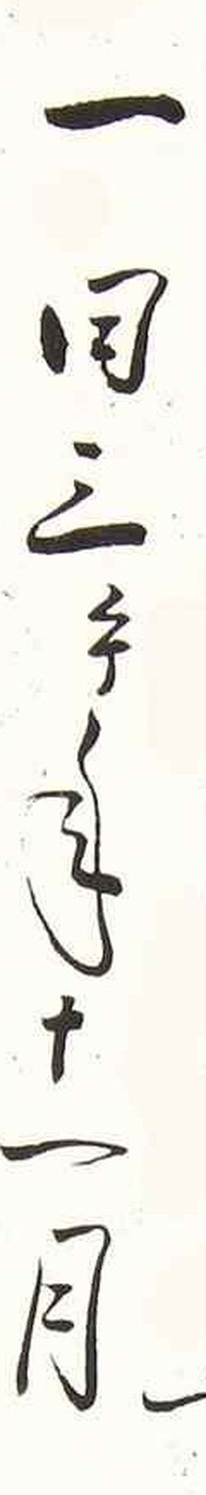一同三午年十一月
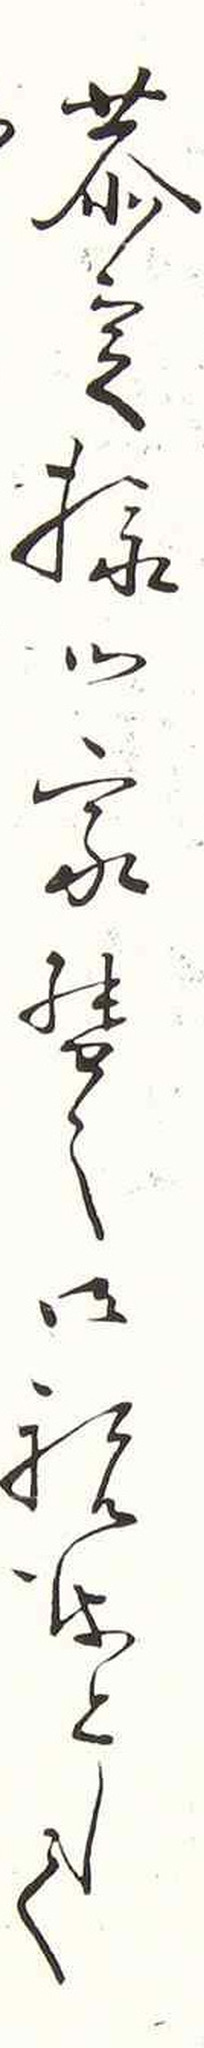恭定様御家督之御祝儀として
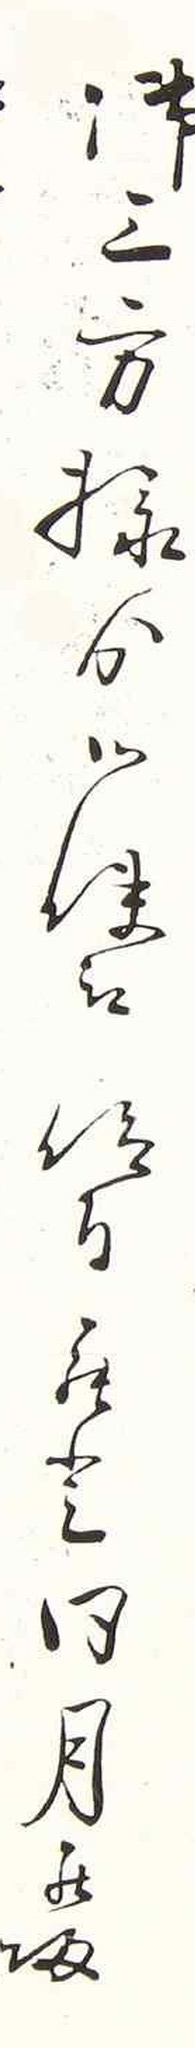御三方様ゟ御使被仰付罷登同月罷帰
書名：諸士系譜　巻之357　す之部7
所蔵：会津若松市立会津図書館
